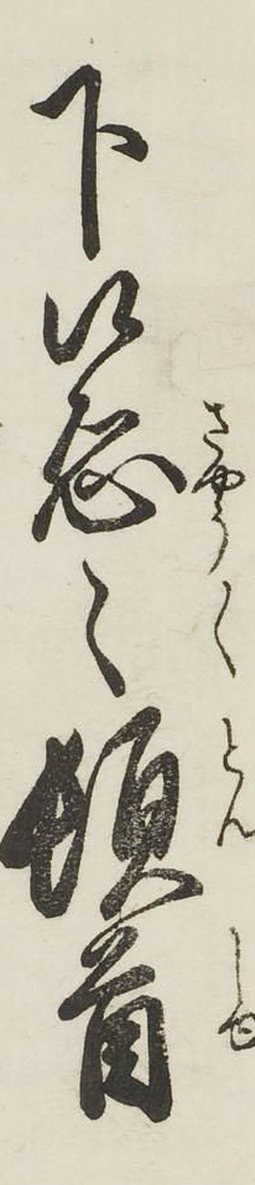下候恐々頓首
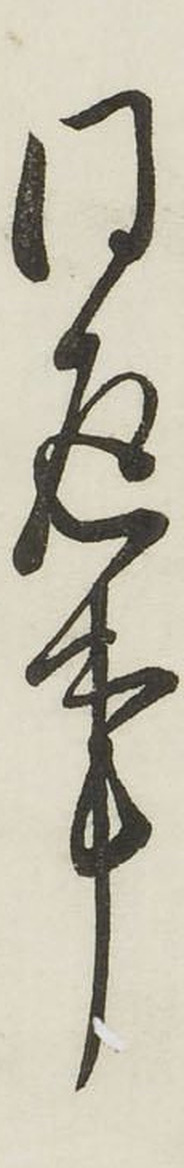同返事
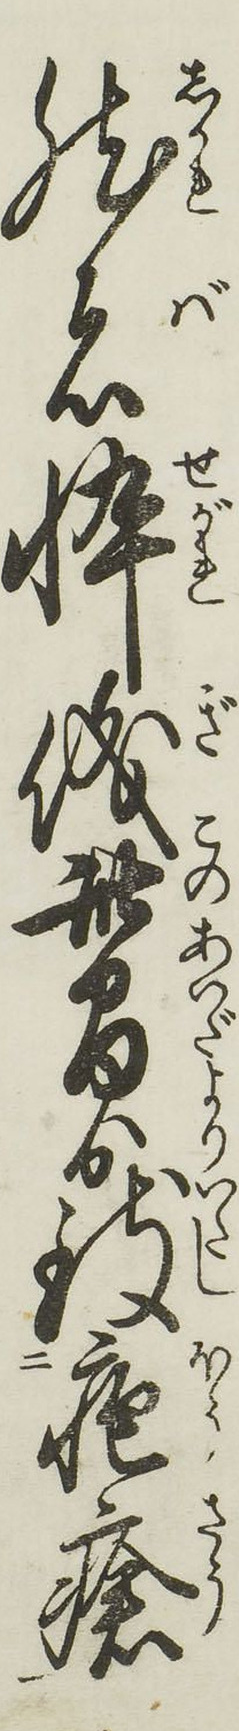然者悴儀此間ゟ致疱瘡

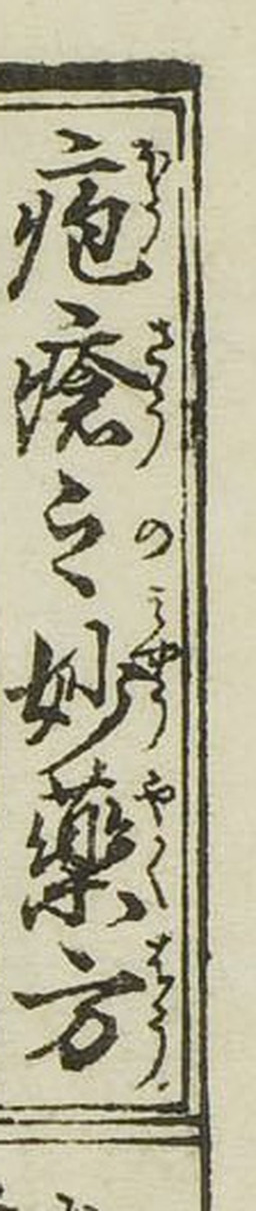疱瘡之妙薬方
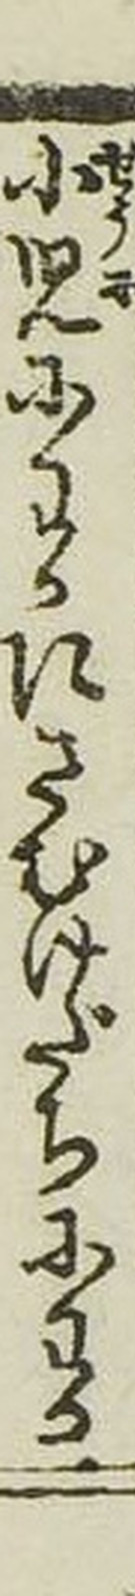小児にわかにさむけだちにわか
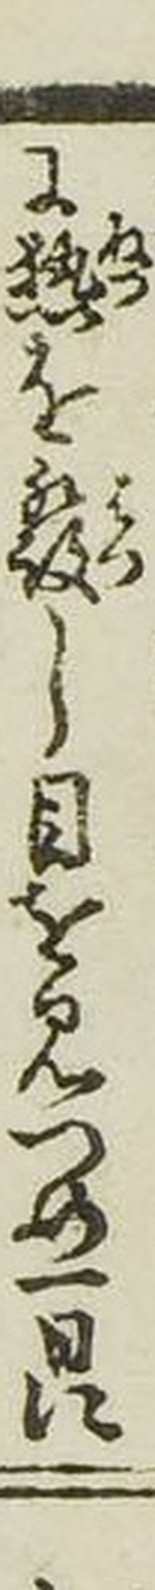に熱を発し目を見つめ一日に
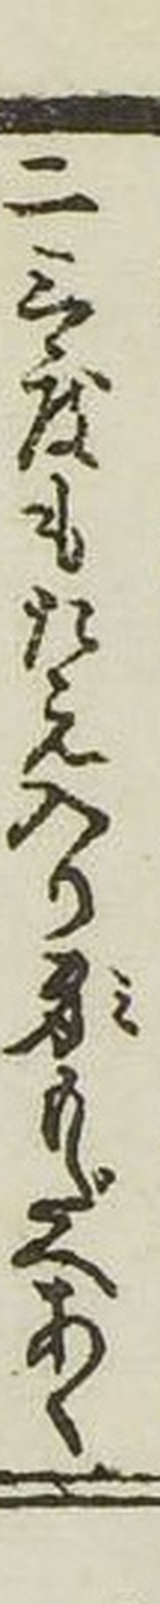二三度もたえ入り身もだへあく
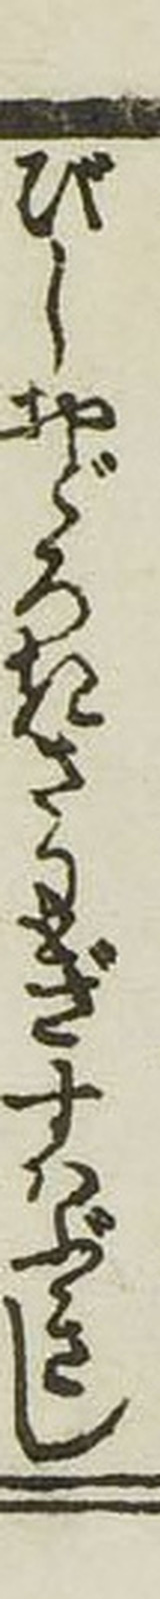びしおどろきさわぎすはぶきし
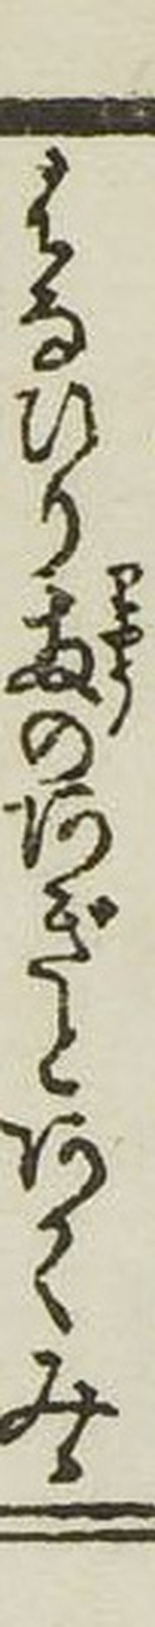はなひり両のあぎとあかくみゝ
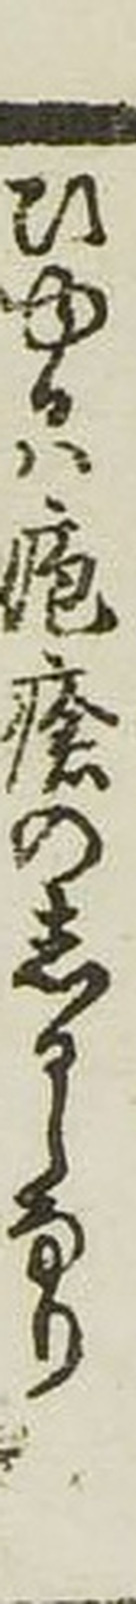ひゆるは疱瘡のしるしなり
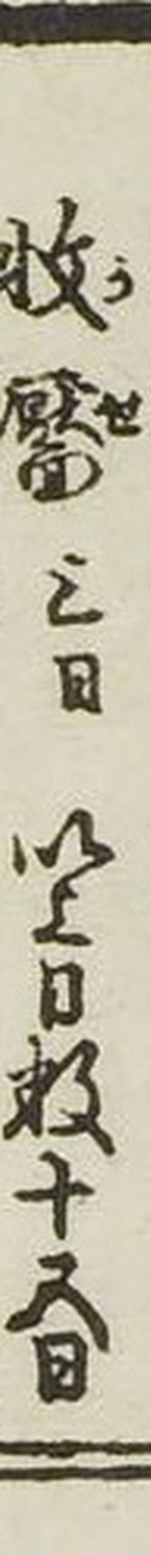収靨三日以上日数十五日
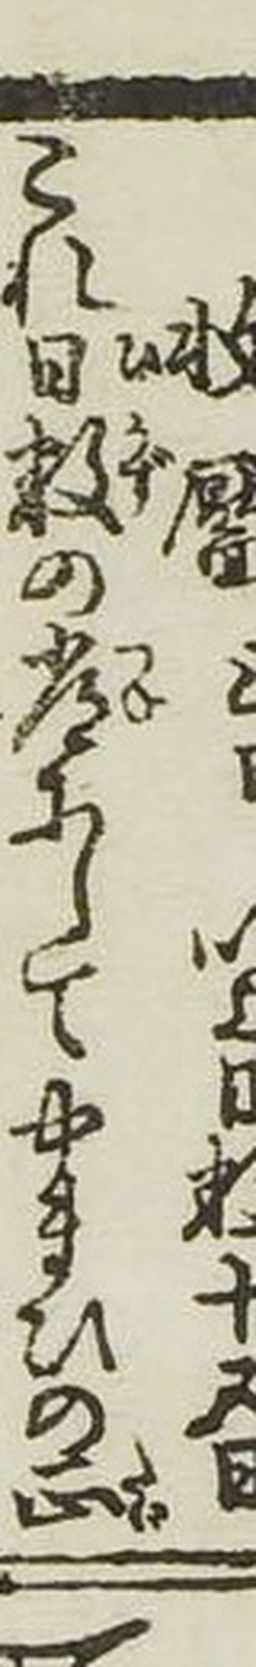これ日数の常にしてやまひの正
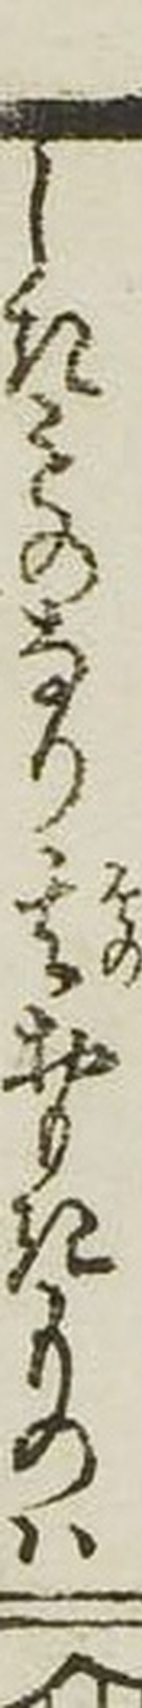しきものなり其おもきものは
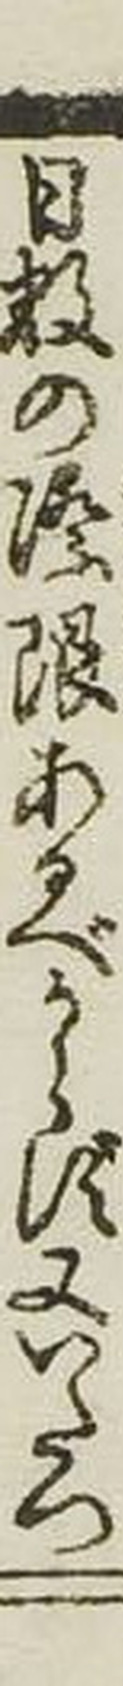日数の際限あるべからず又いたつ
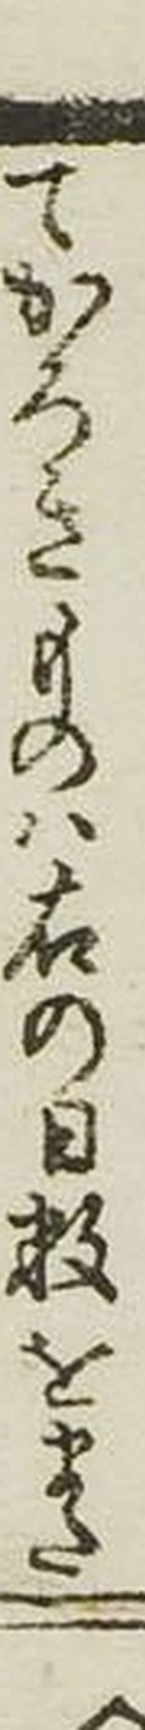てかろきものは右の日数をまた
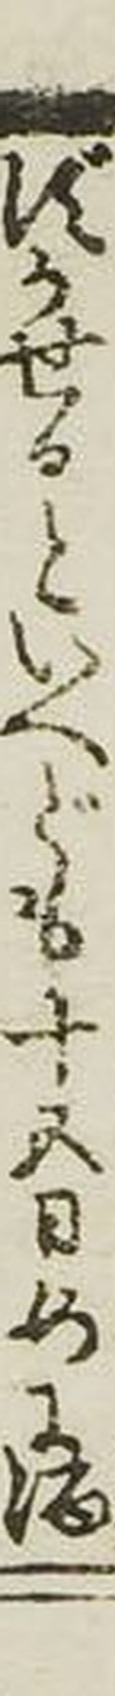ずうせるといへども十五日めに酒
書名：商人書翰便覧
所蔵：東京学芸大学教育コンテンツアーカイブ
